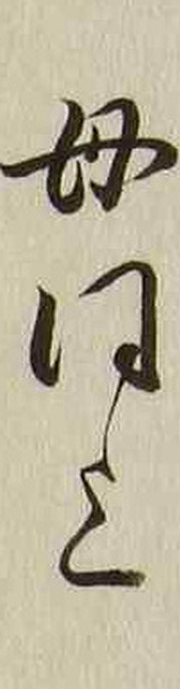母同上
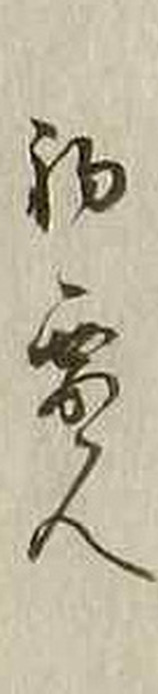初要人
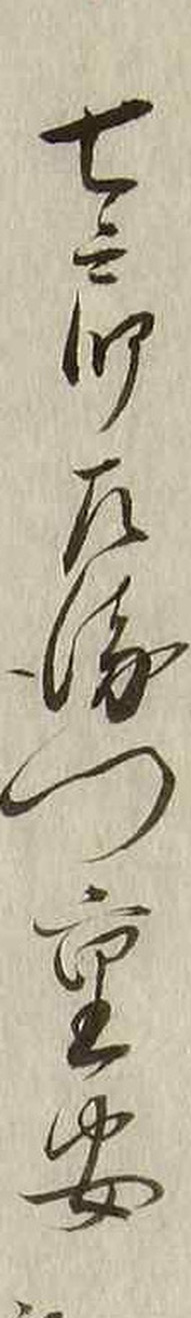七郎左衛門重安
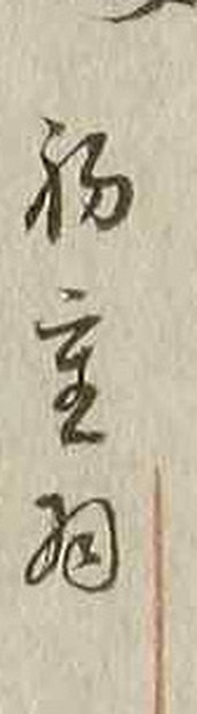初重羽
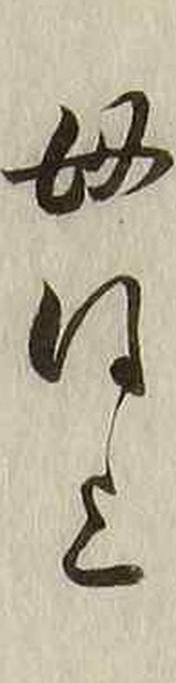母同上
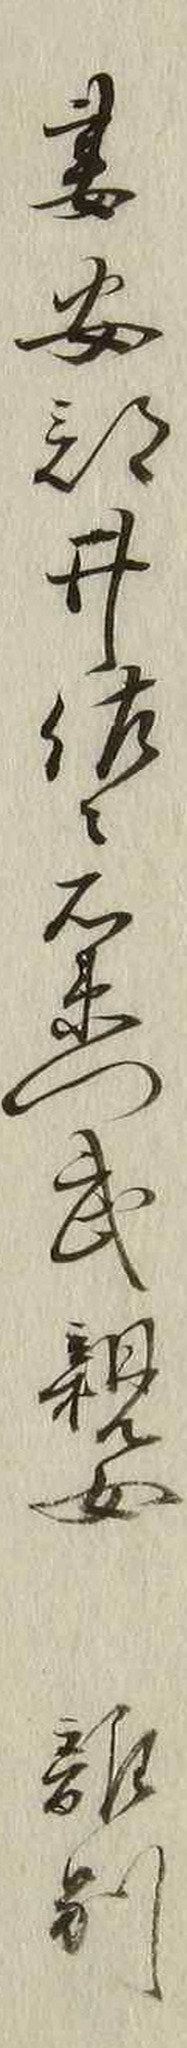妻安部井佐々右衛門武親女離別
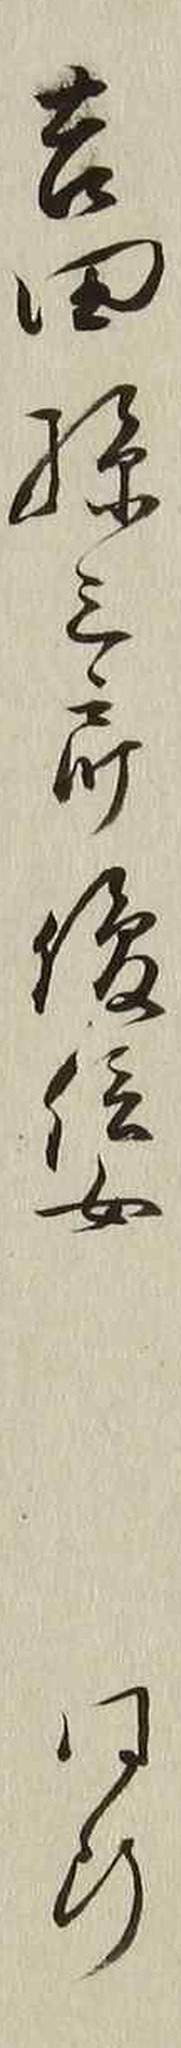吉田孫三郎俊信女同断
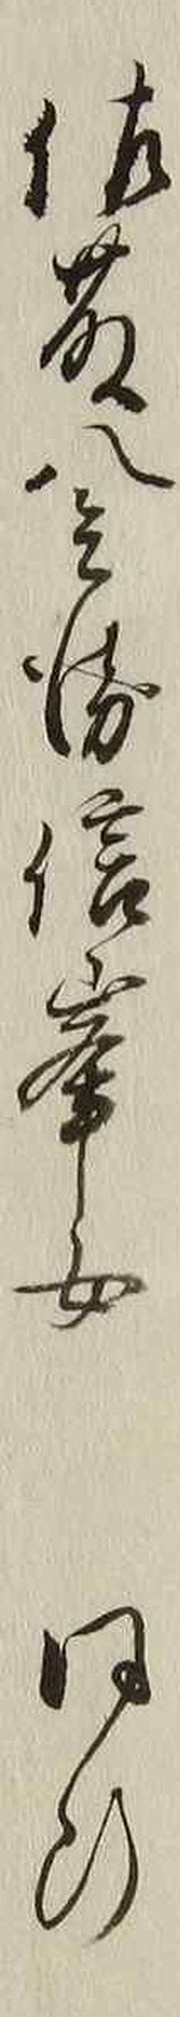佐藤八兵衛信峯女同断
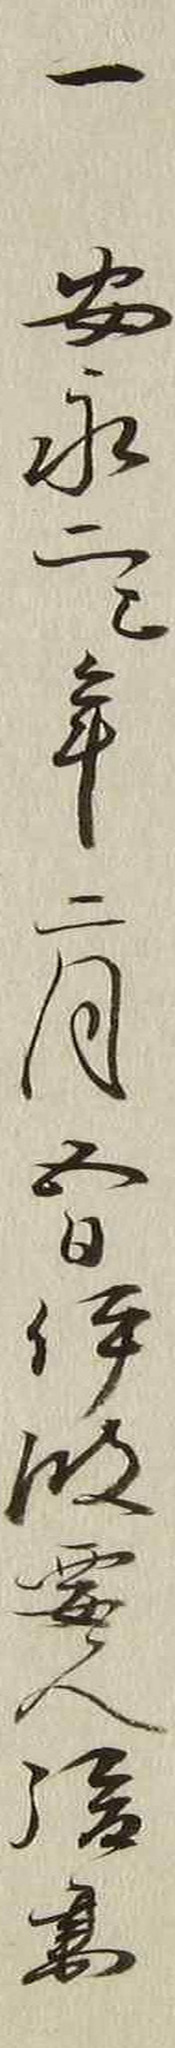一安永二巳年二月五日伊波要人俊高
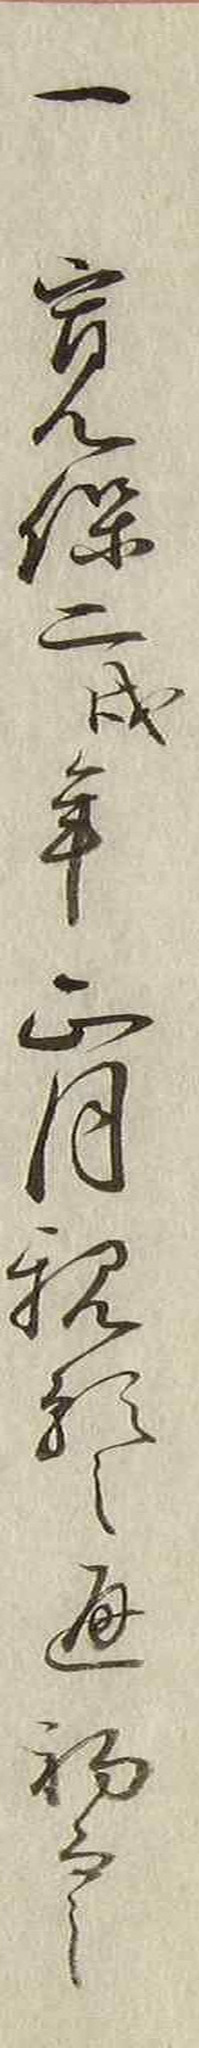一寛保二戌年正月親願い之通初めて之
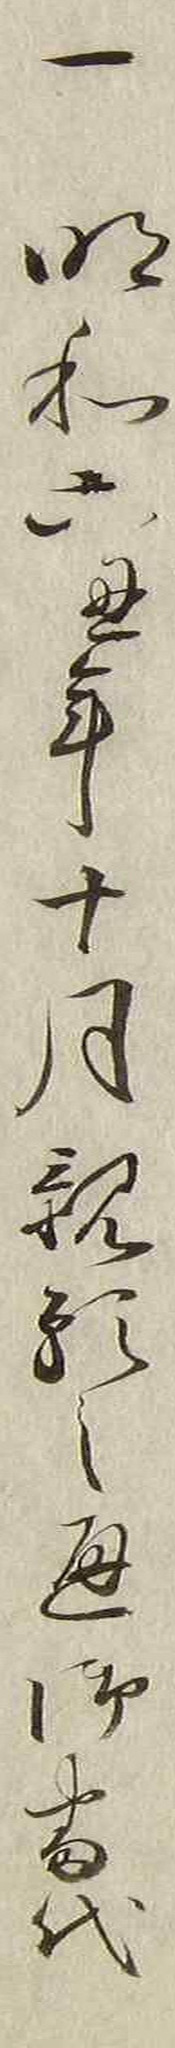一明和六丑年十月親願い之通御番代

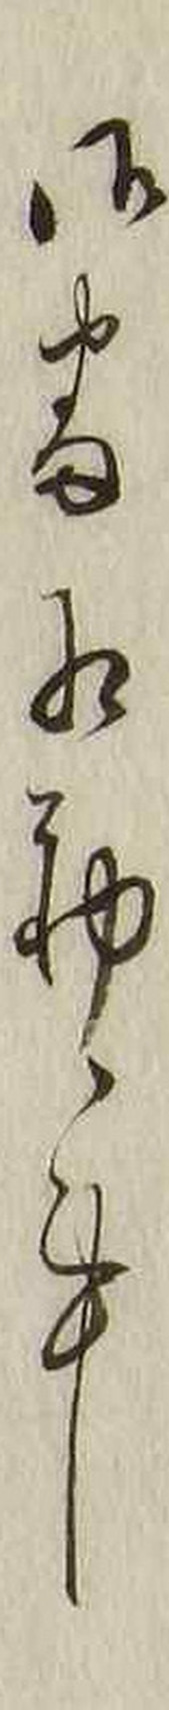御番相勤め候事
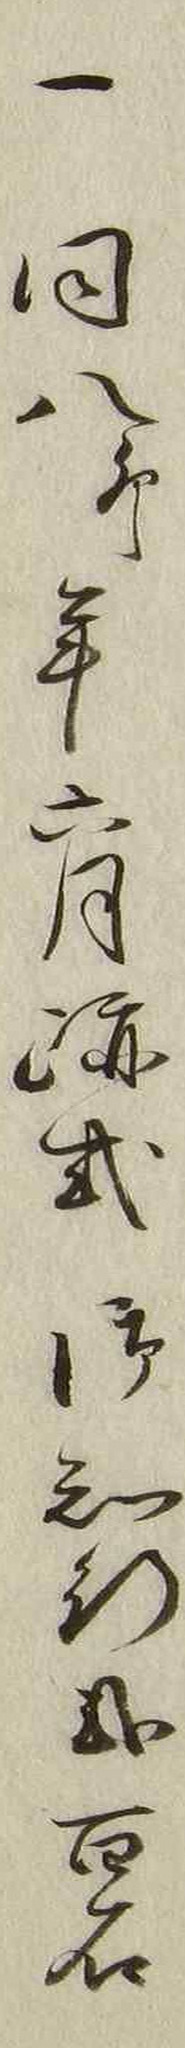一同八卯年六月跡式御知行弐百石
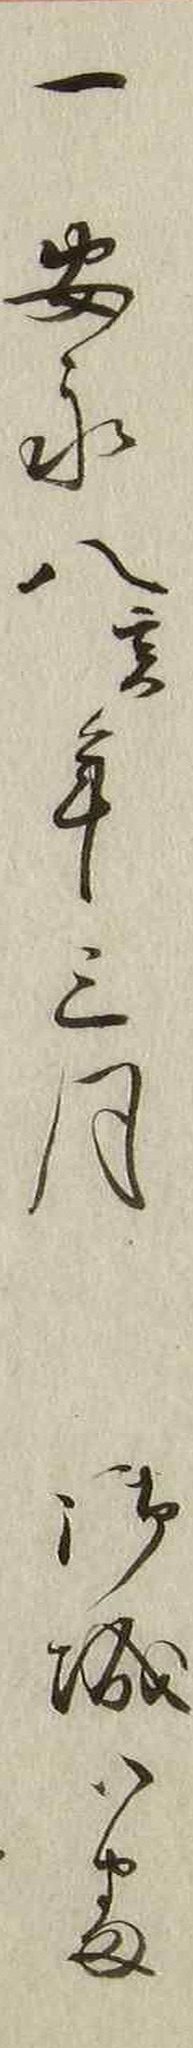一安永八亥年三月御城御番
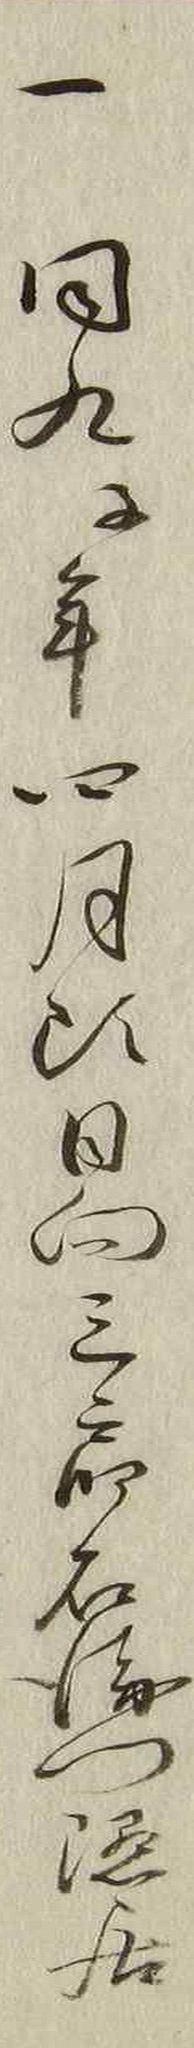一同九子年四月頃日向三郎右衛門隠居
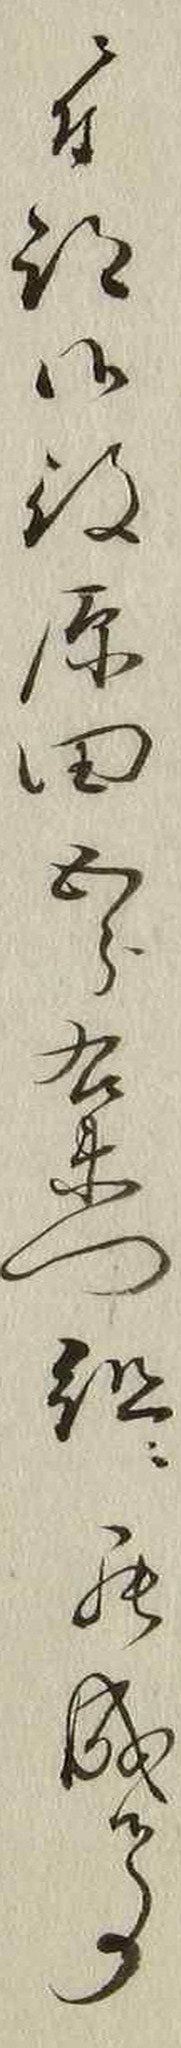ニ付き跡御役原田五郎右衛門組ニ罷り成り候事
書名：諸士系譜　巻之20　い之部20
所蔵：会津若松市立会津図書館
